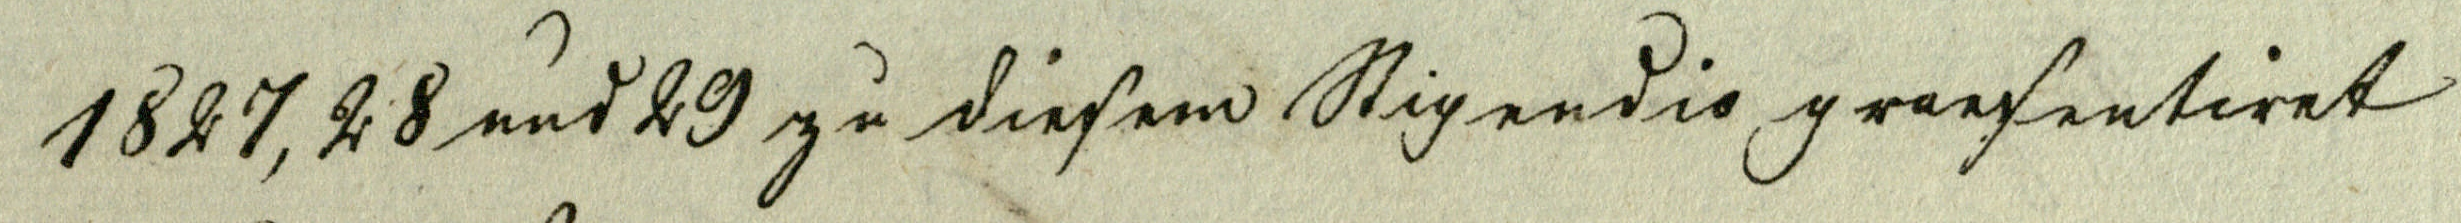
1827, 28 und 29 zu diesem Stipendio praesentiret
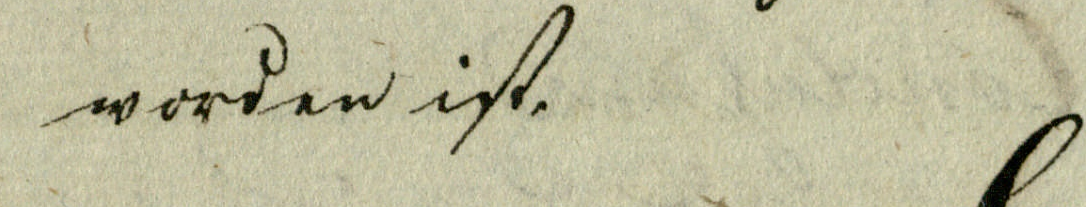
worden ist.
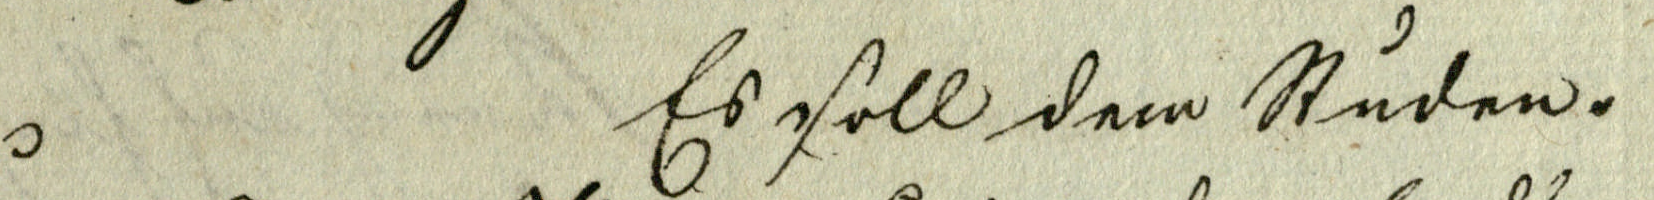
Es soll dem Studen¬
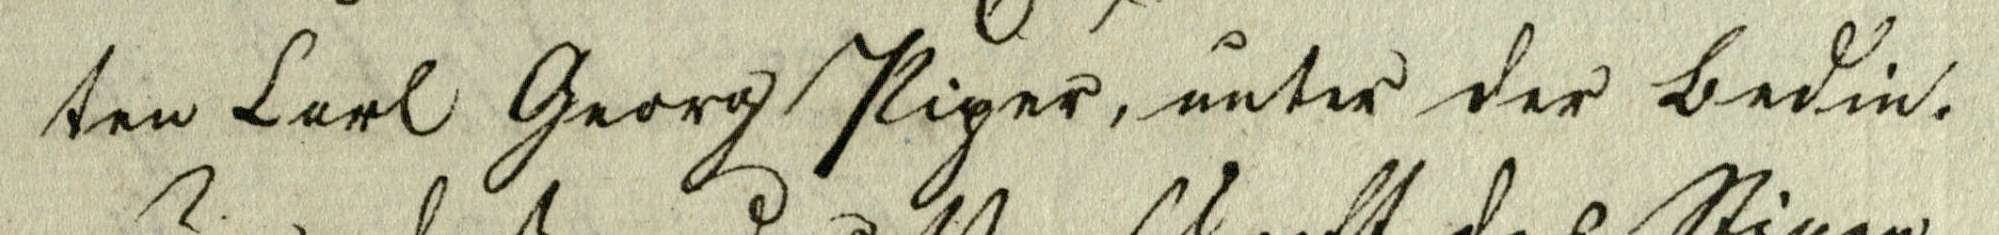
ten Carl Georg Piper, unter der Bedin¬
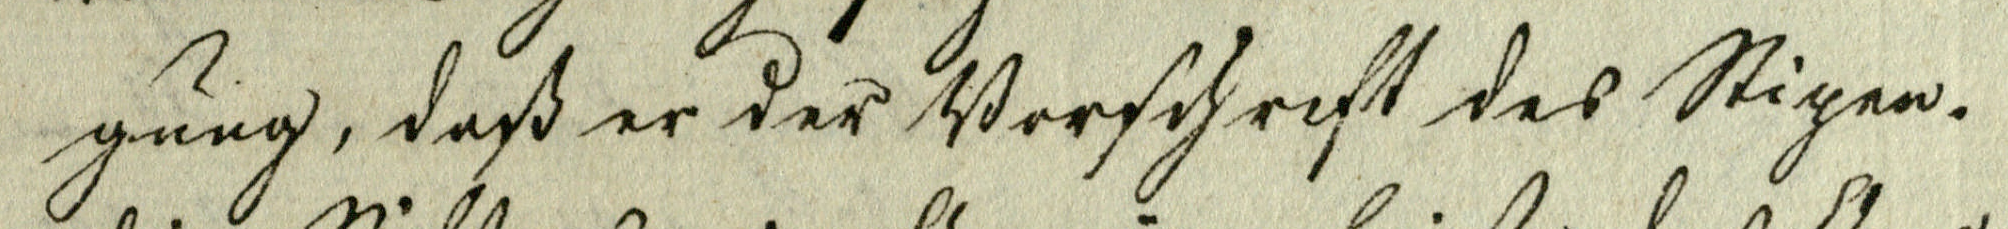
gung, daß er der Vorschrift des Stipen¬
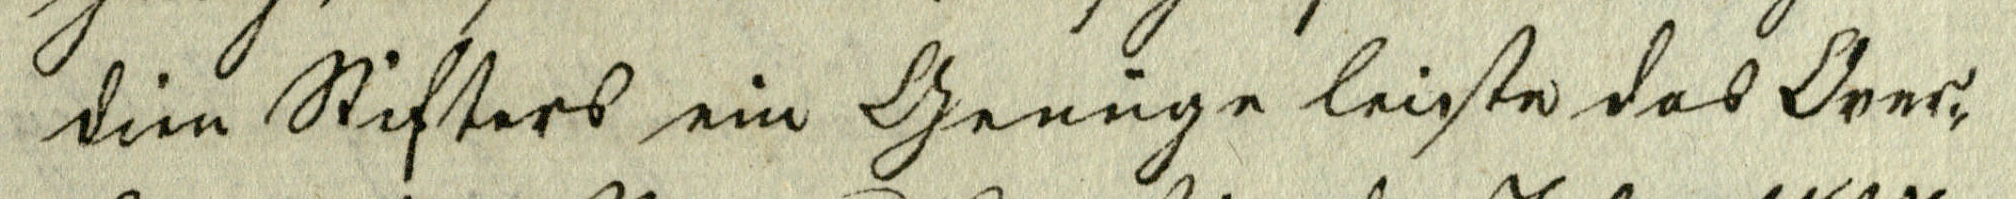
dien Stifters ein Genüge leiste das Over¬
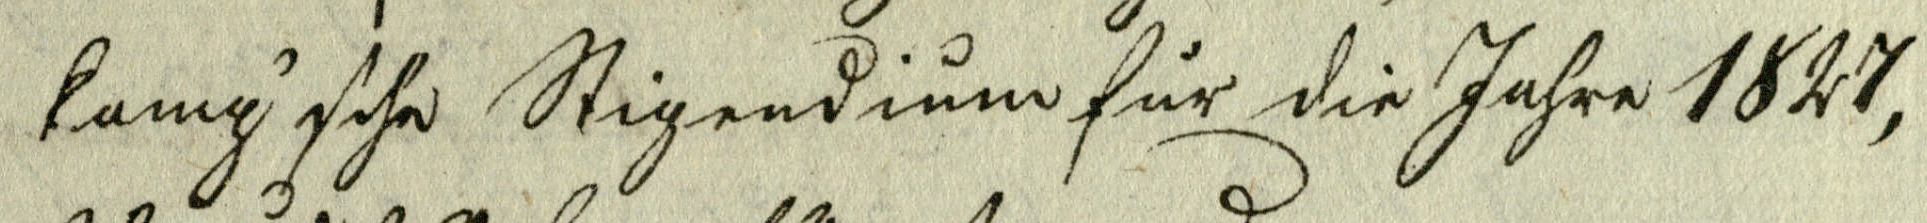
kamp'sche Stipendium für die Jahre 1827,
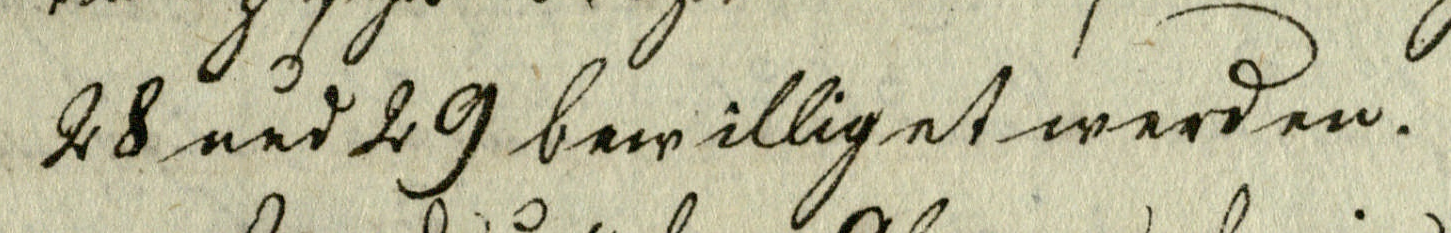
28 und 29 bewilliget werden.
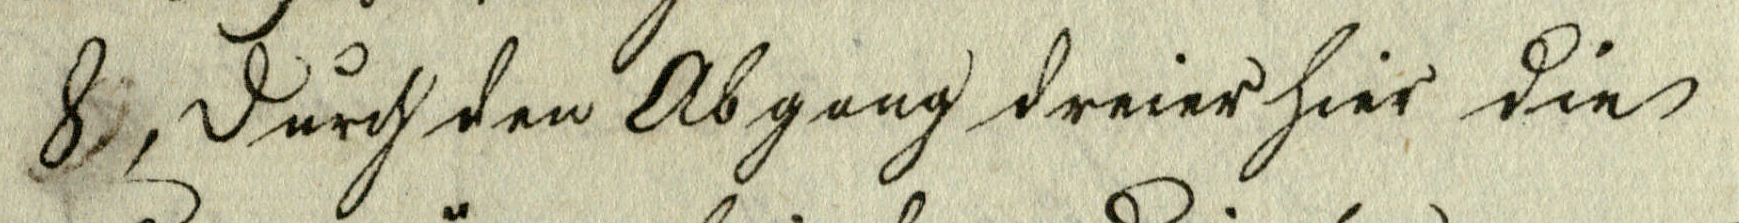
8, Durch den Abgang dreier hier die
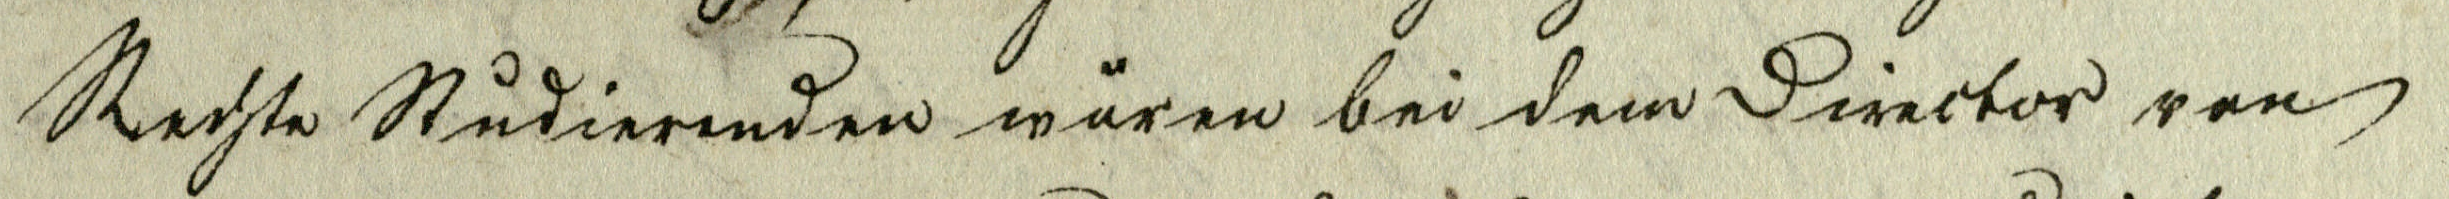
Rechte Studierenden wären bei dem Director von
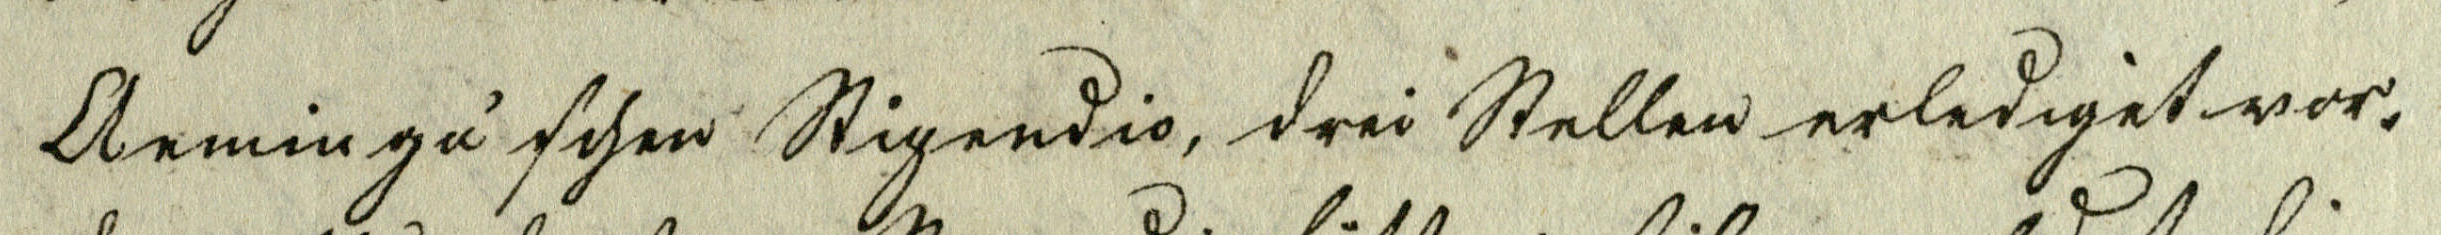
Aeminga'schen Stipendio, drei Stellen erlediget wor¬
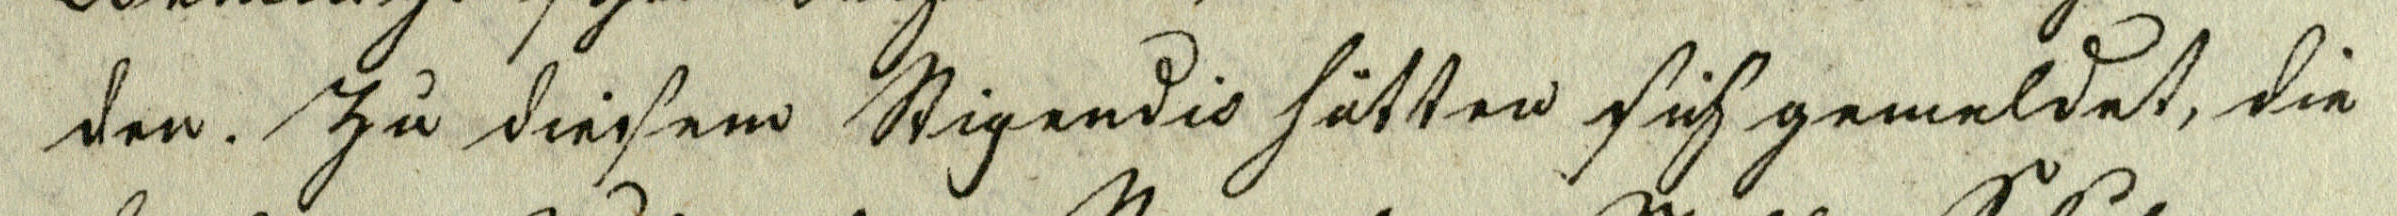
den. Zu diesem Stipendio hätten sich gemeldet, die
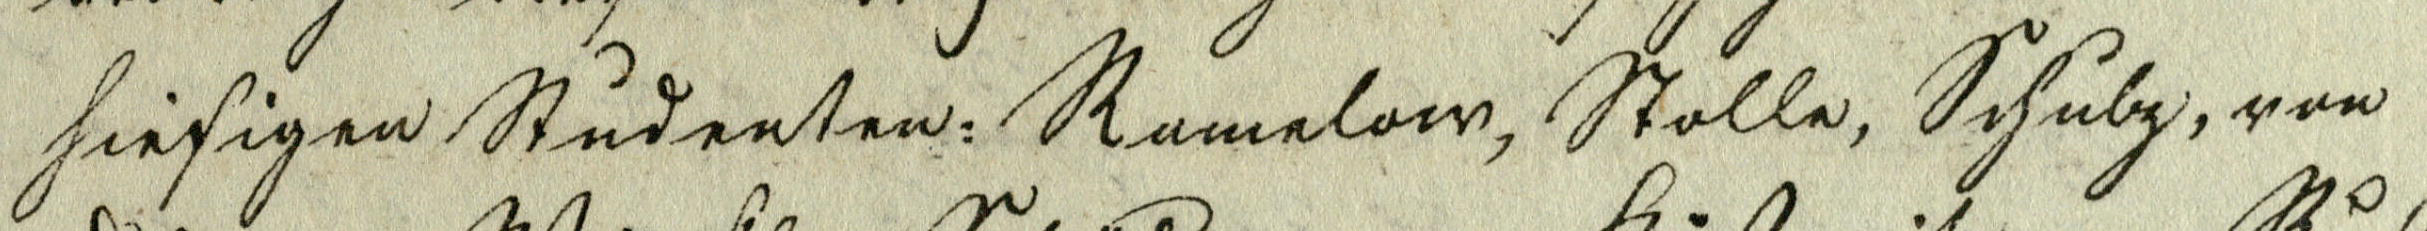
hiesigen Studenten: Ramelow, Stolle, Schulz, von
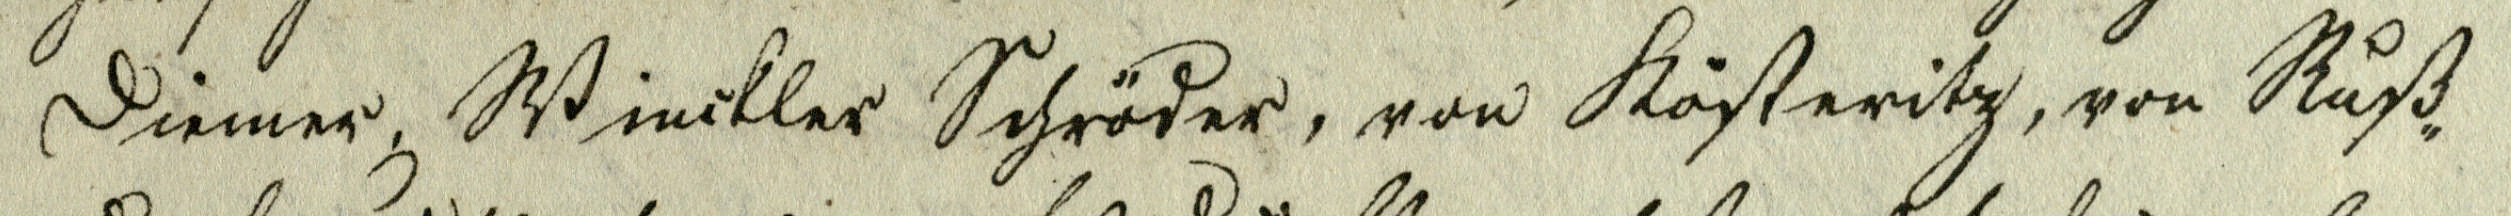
Diemer, Winckler, Schröder, von Kösteritz, von Ruß¬
